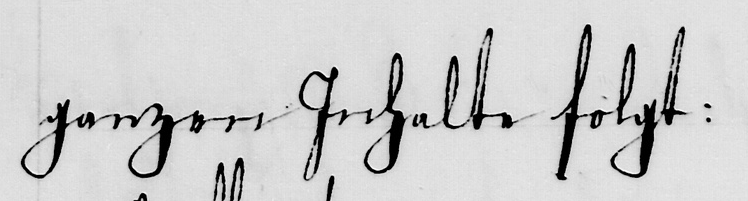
ganzen Inhalte folgt:
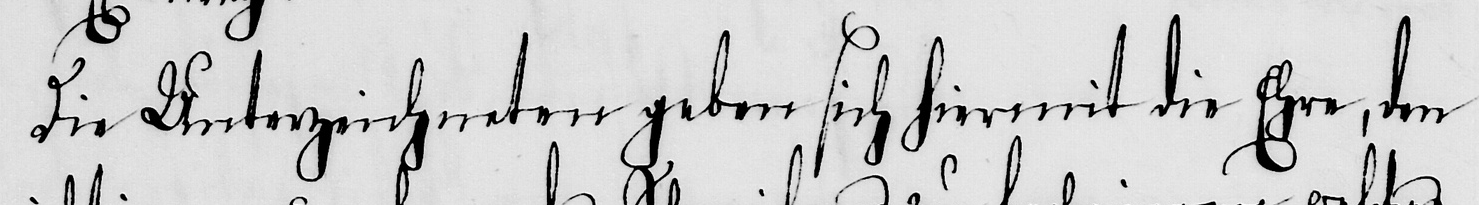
Die Unterzeichneten geben sich hiermit die Ehre, den
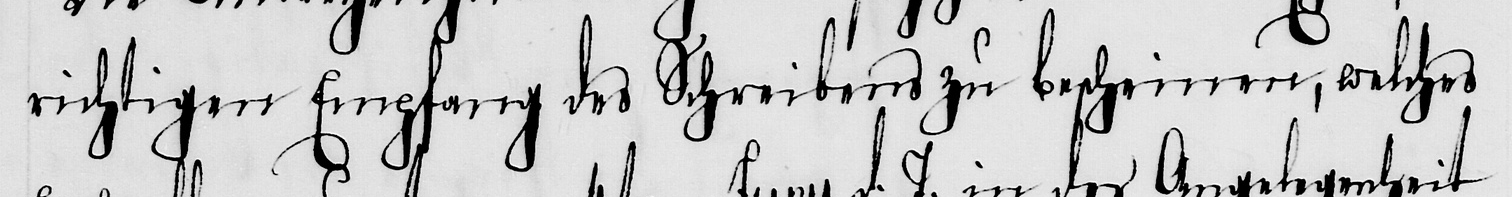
richtigen Empfang des Schreibens zu bescheinen, welches
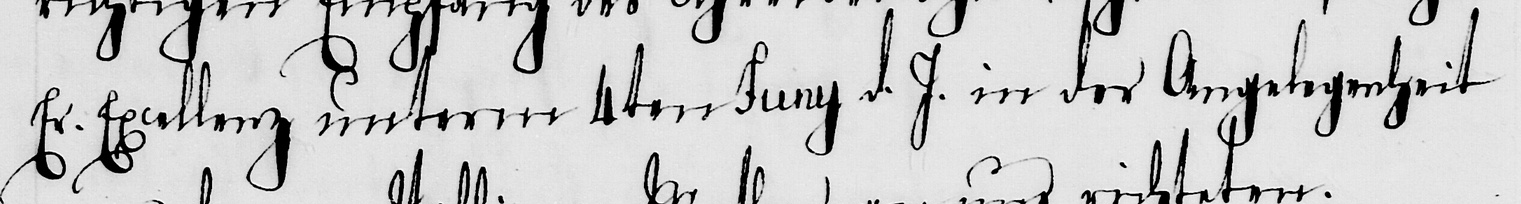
Er. Excellenz unterm 4ten Juny d. J. in der Angelegenheit
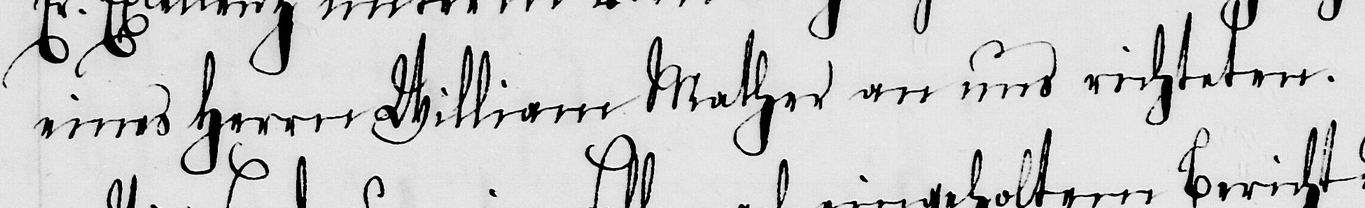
eines Herrn William Mather an uns richteten.
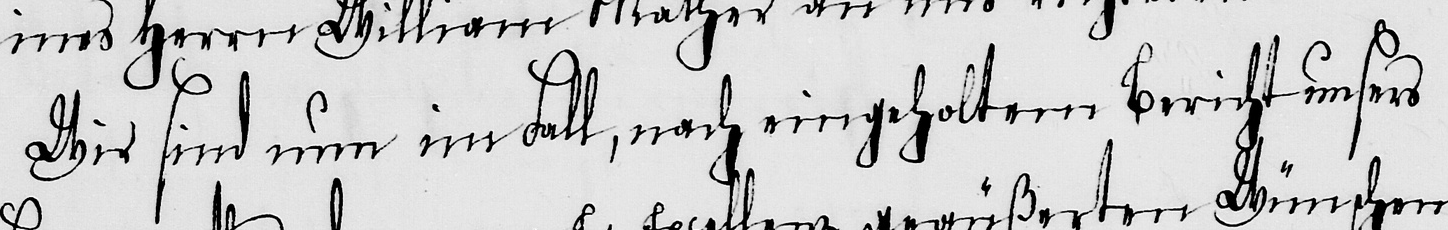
Wir sind nun im Fall, nach eingeholtem Bericht unsers
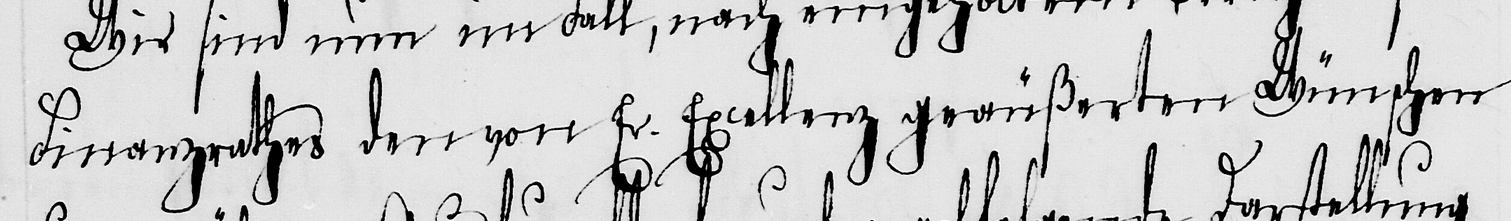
Finanzrathes den von Er. Excellenz geäußerten Wünschen
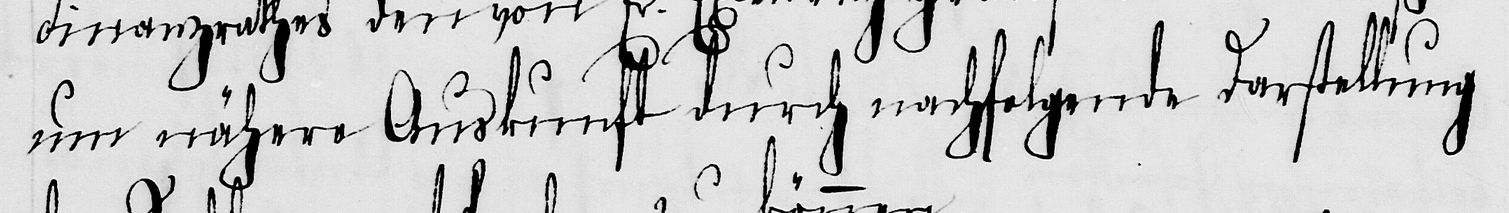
um nähere Auskunft durch nachfolgende Darstellung
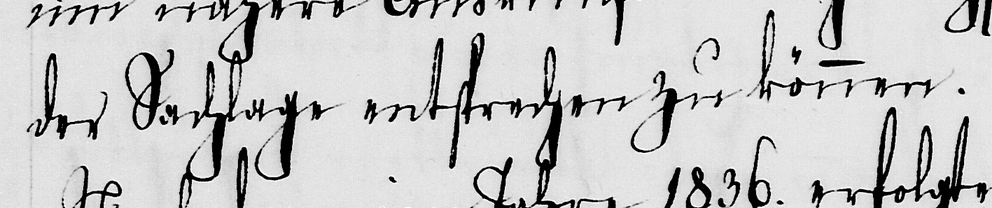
der Sachlage entsprechen zu können.
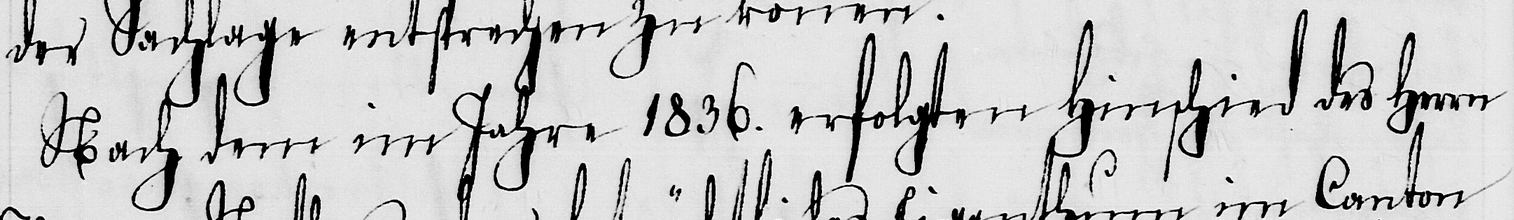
Nach dem im Jahre 1836. erfolgten Hinschied des Herrn
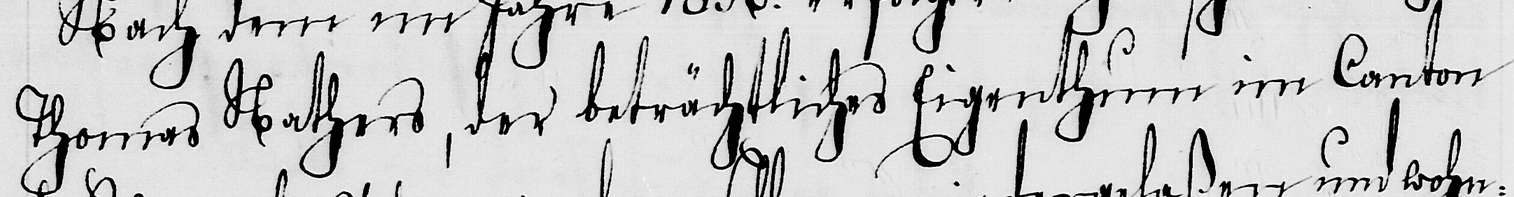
Thomas Nathers, der beträchtliches Eigenthum im Canton
